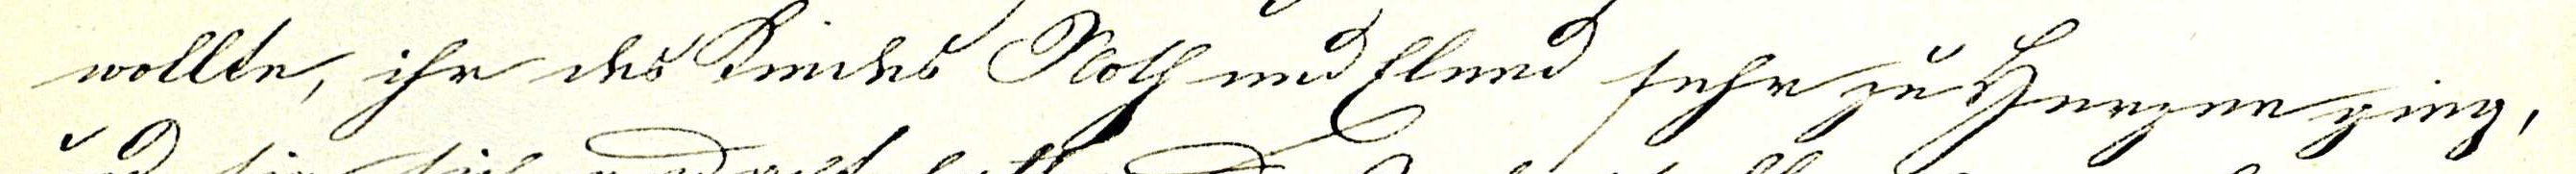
wollte, ihr des Kindes Noth und Elend sehr zu Herzen ging,
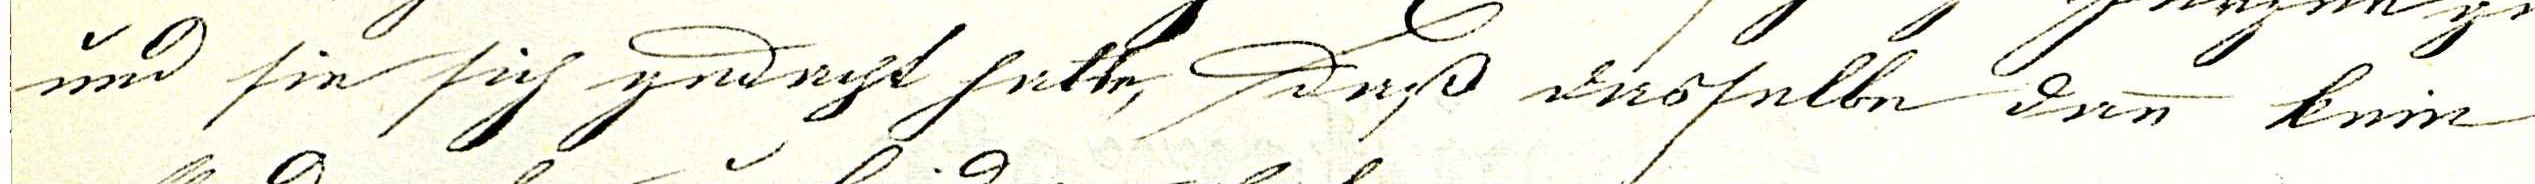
und sie sich gedacht hatte, daß dasselbe dann kein
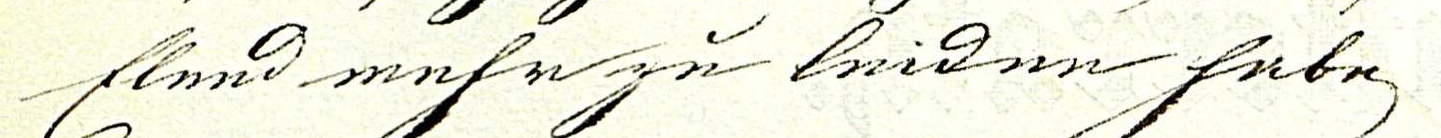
Elend mehr zu leiden habe.
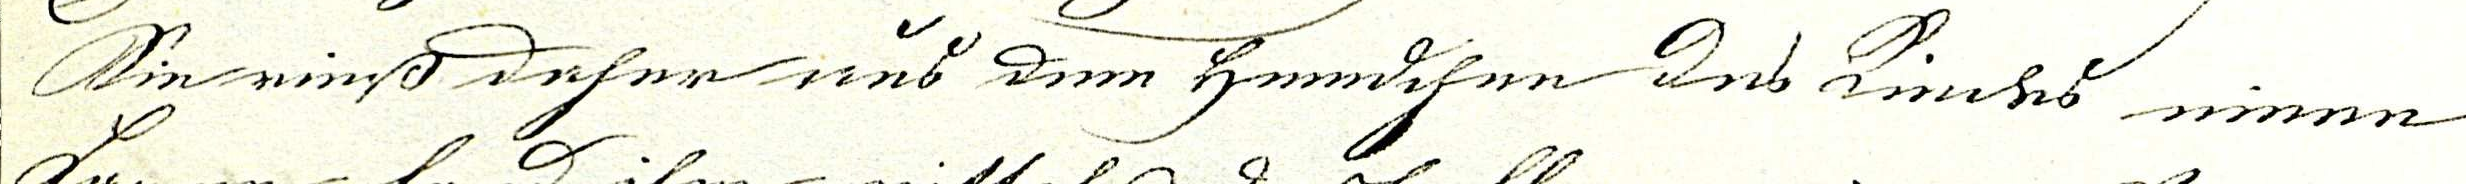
Sie rieß daher aus dem Hemdchen des Kindes einen
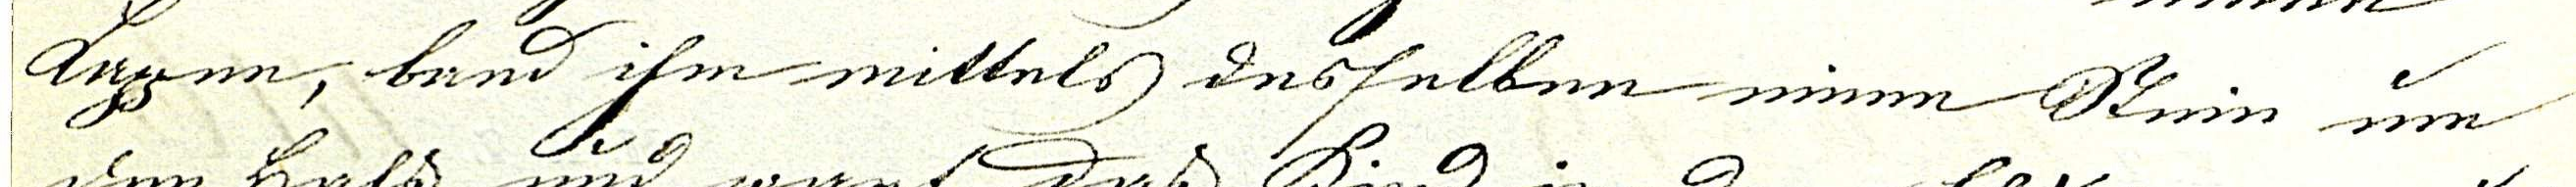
Lappen, band ihm mittels desselben einen Stein um
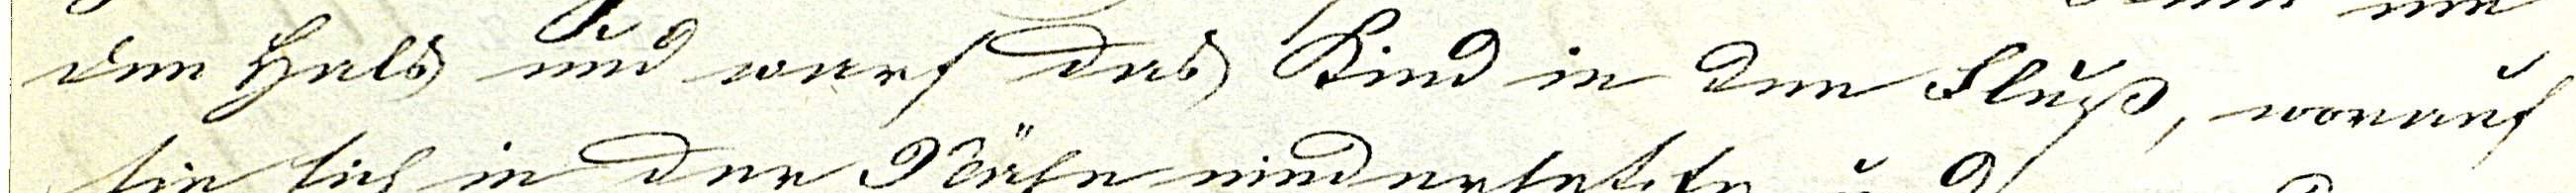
den Hals und warf das Kind in den Fluß, worauf
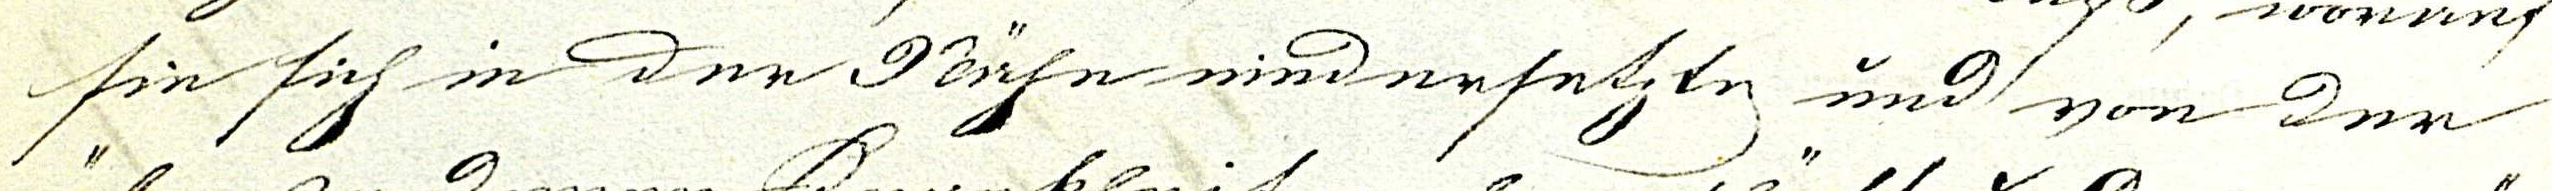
sie sich in der Nähe niedersetzte und von der
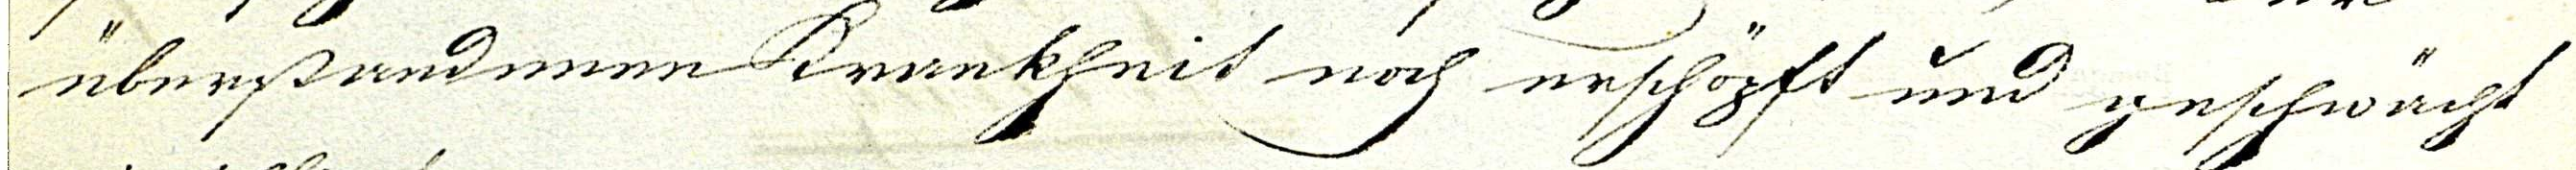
überstandenen Krankheit noch ersch¨pft und geschwächt
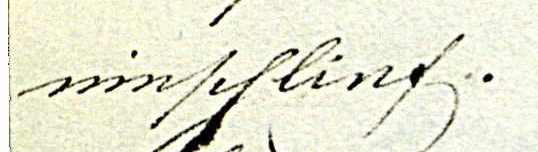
einschlief.
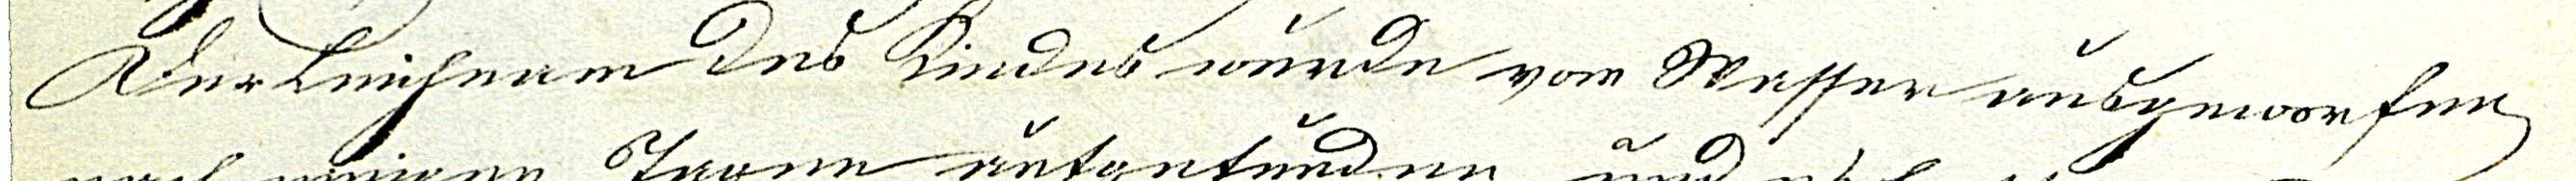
Der Leichnam des Kindes wurde vom Wasser ausgeworfen
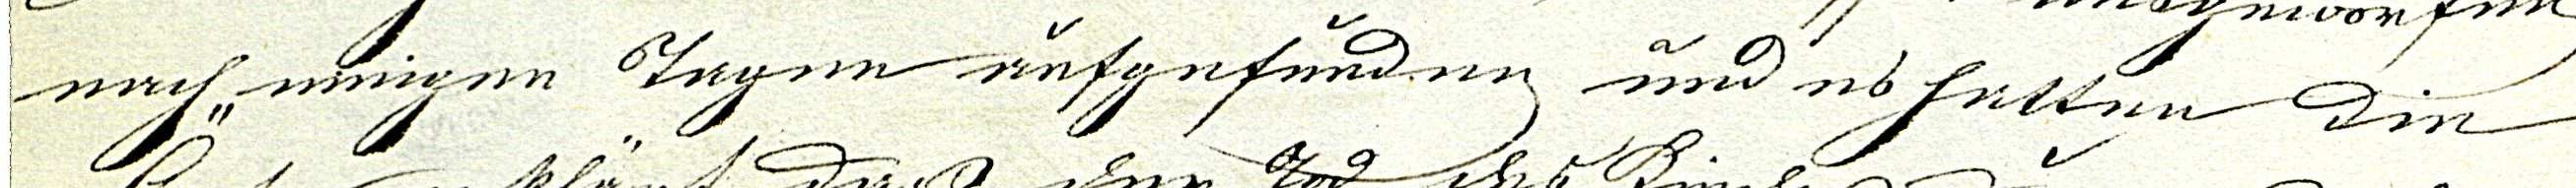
nach einigen Tagen aufgefunden und es hatten die
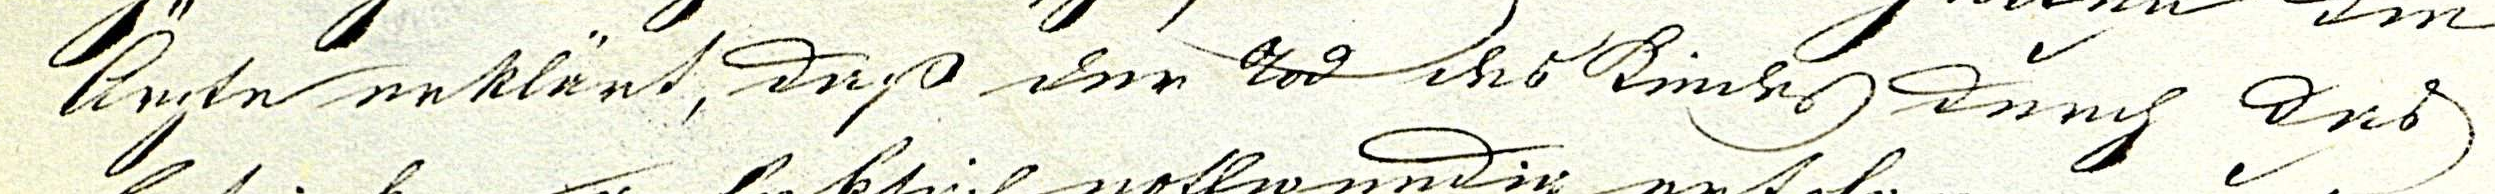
Ärzte erklärt, daß der Tod des Kindes durch das
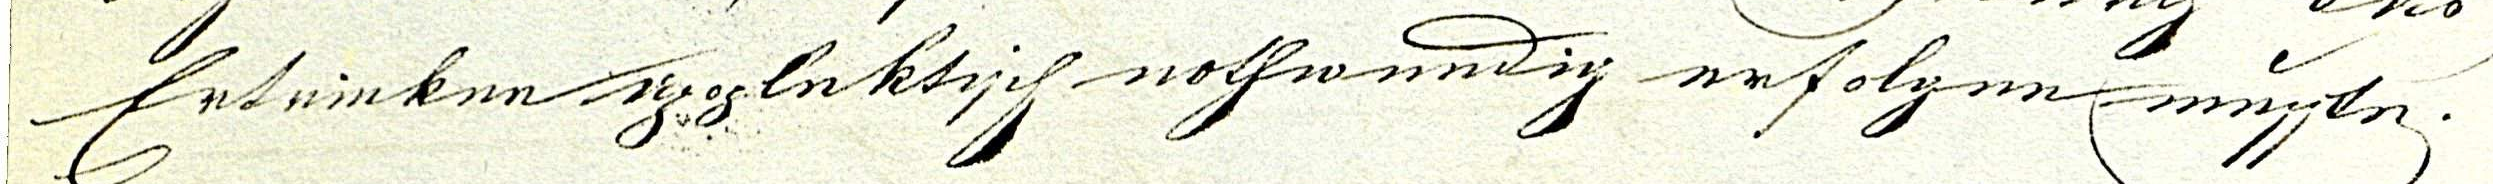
Ertrinken apoplektisch nothwendig erfolgen musste.
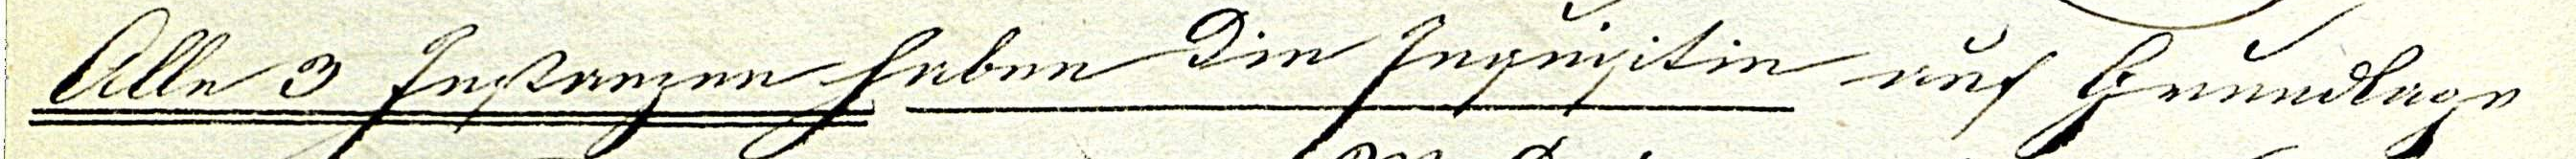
Alle 3 Instanzen haben die Inquisiten auf Grundlage
